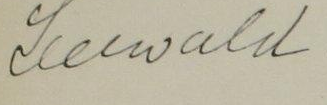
Seewald
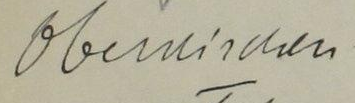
Oberkirchen
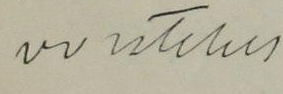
vorsteher
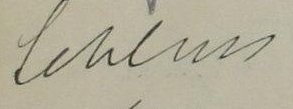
Schluss
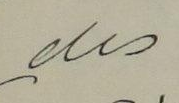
des
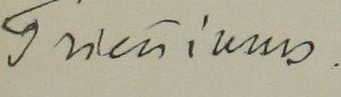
Trienniums
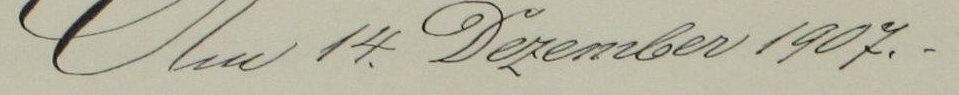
Am 14. Dezember 1907.
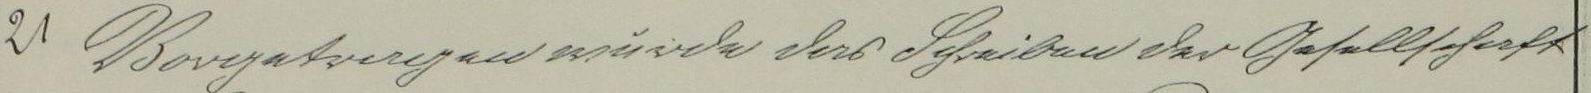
21. Vorgetragen wurde das Schreiben der Gesellschaft
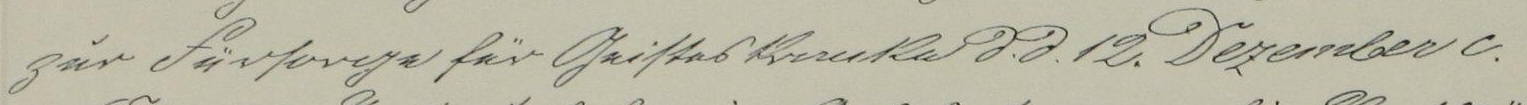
zur Fürsorge für Geisteskranke d.d. 12. Dezember c.
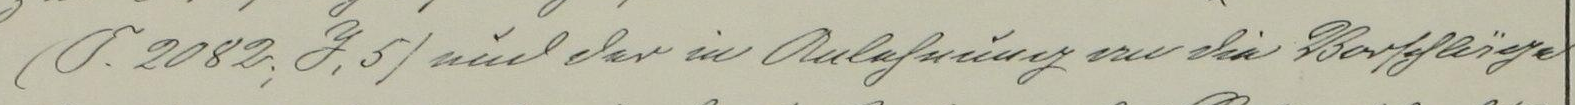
(T.2082; I.5) und der in Anlehnung an die Vorschläge
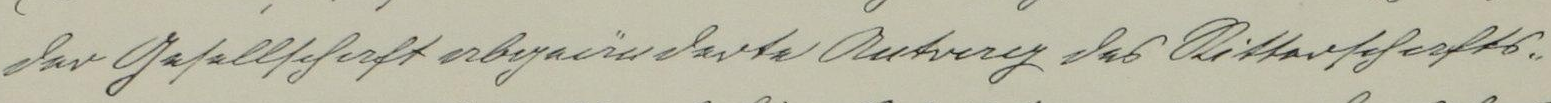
der Gesellschaft abgeänderte Antrag des Ritterschafts-
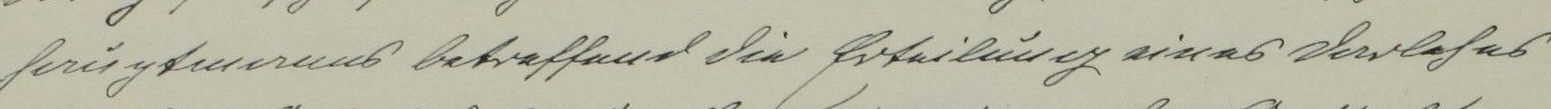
hauptmanns betreffend die Erteilung eines Darlehns
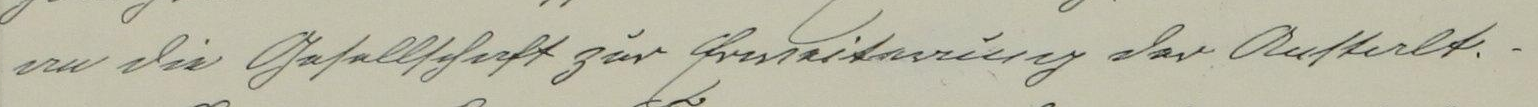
an die Gesellschaft zur Erweiterung der Anstalt.
